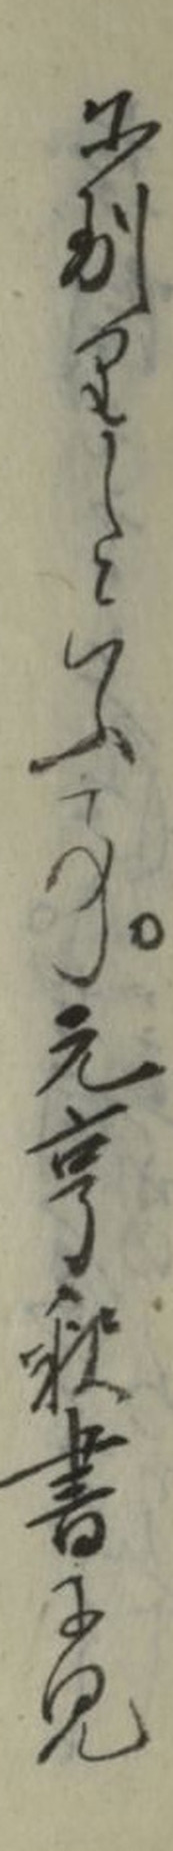に到りしといふ事。元亨釈書に見
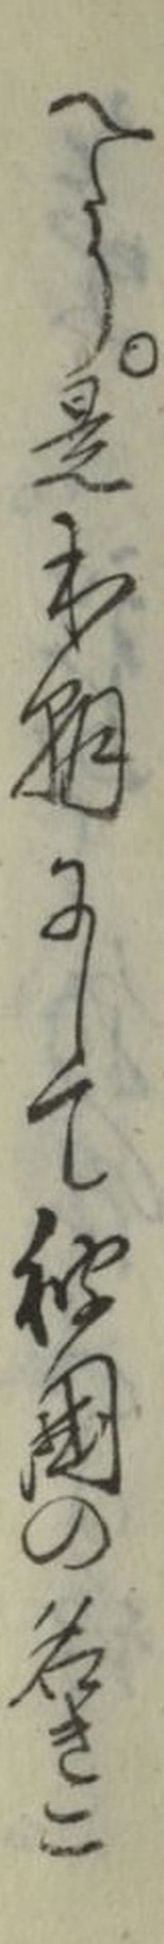へたり。是本朝にして彼国の名きこ
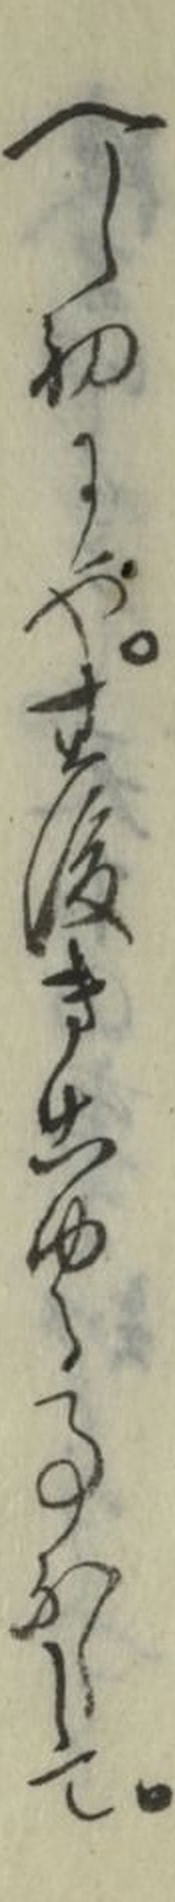へし初にや。其後きこゆる事なくして。
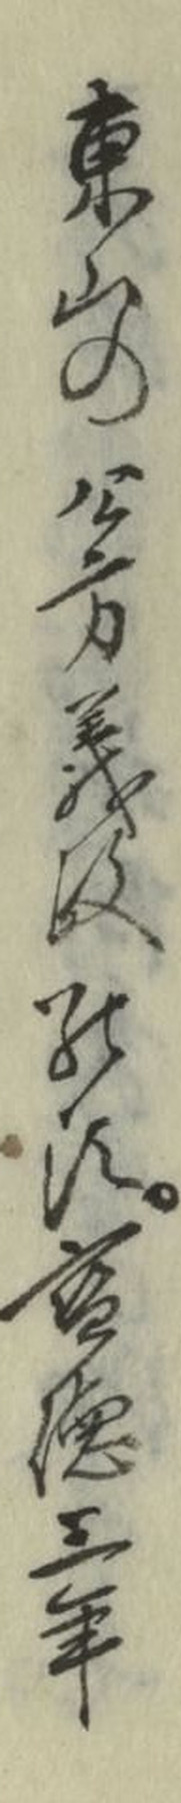東山の公方義政の頃。享徳三年

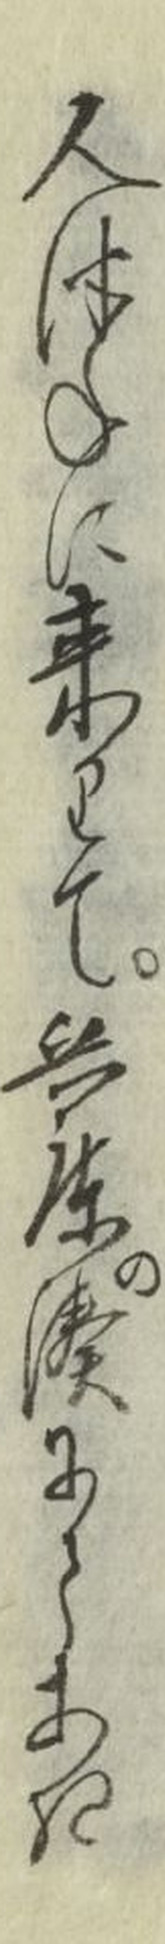人つねに来りて。兵庫の湊にてあき
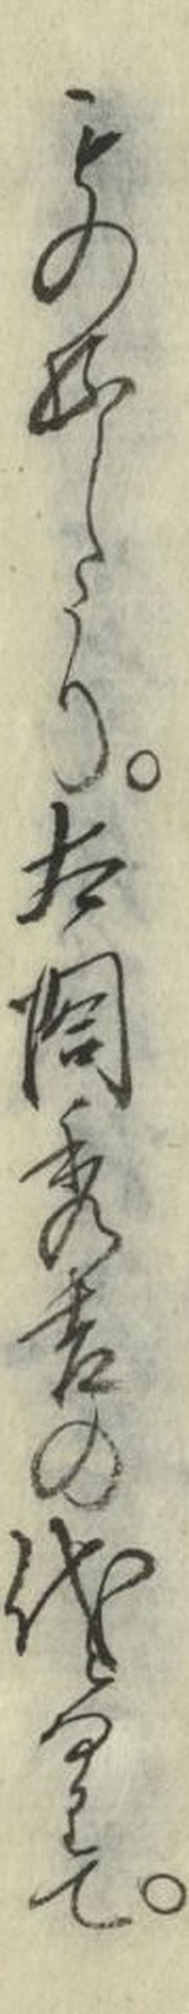もの等したり。太閤秀吉の代になりて。
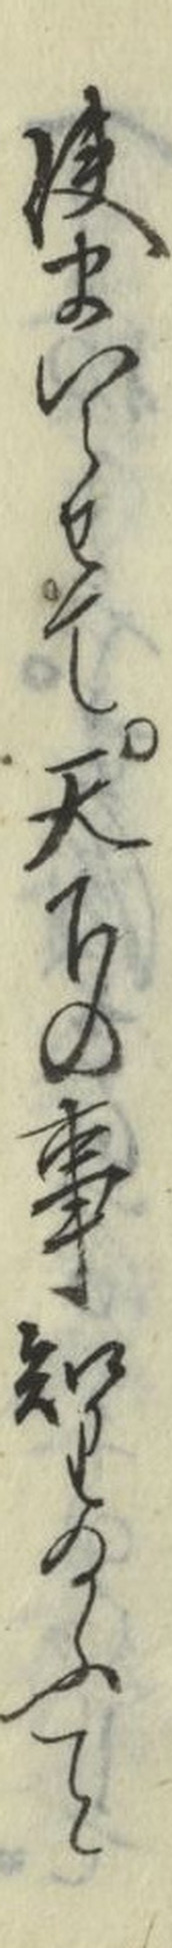使まいらせて。天下の事知り給ふこと
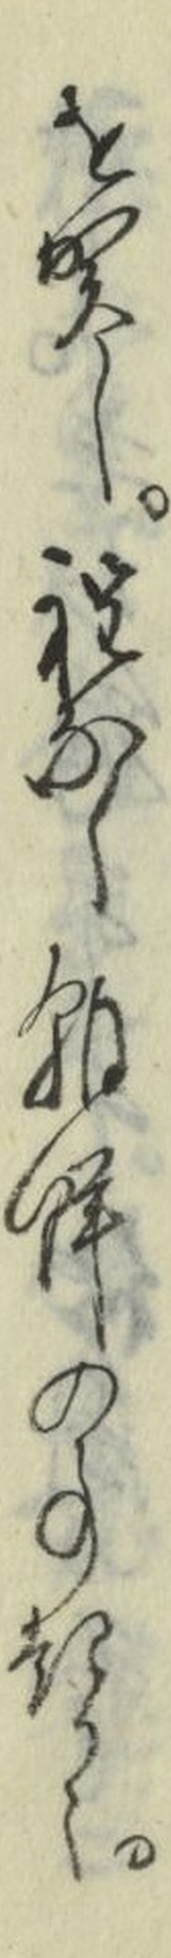を賀し。程なく朝鮮の事起りて。
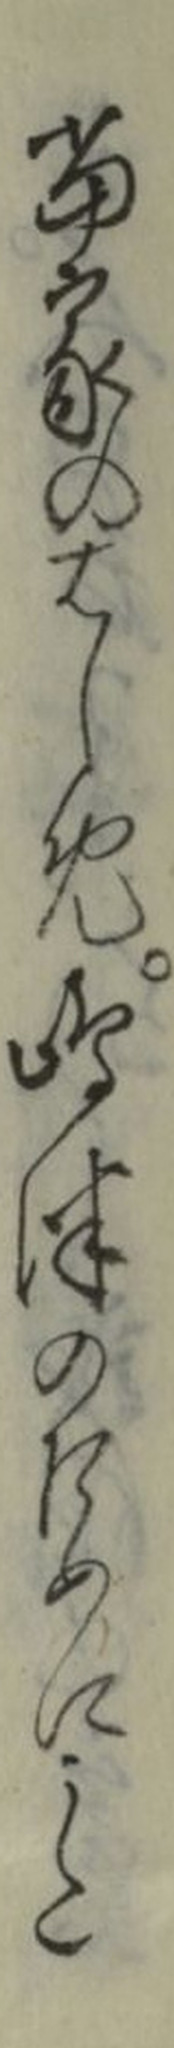当家のはしめ。島津のためにみた
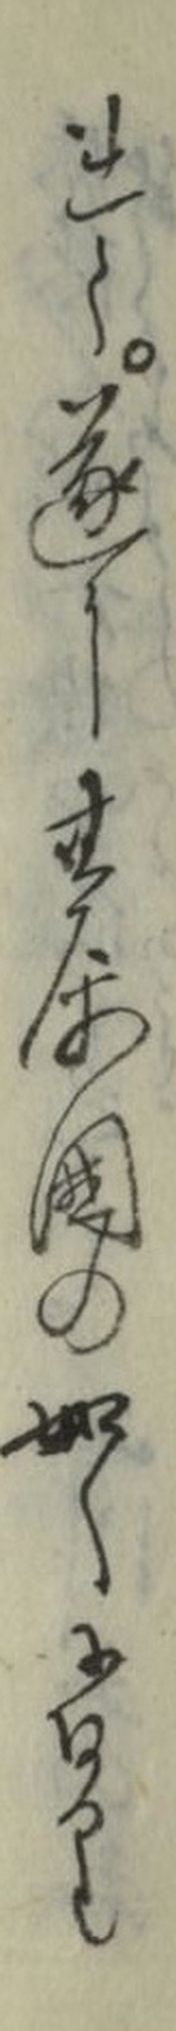れて。遂に其属国の如くになり
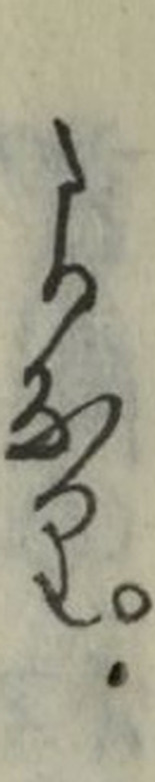たるなり。
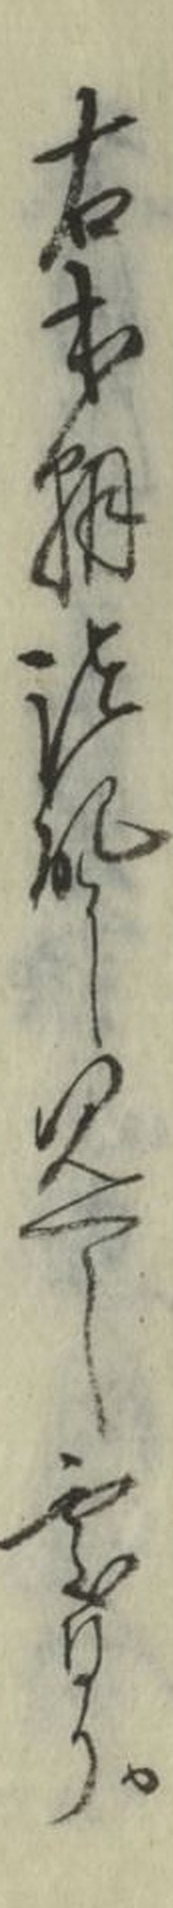右本朝諸記に見へし処なり。
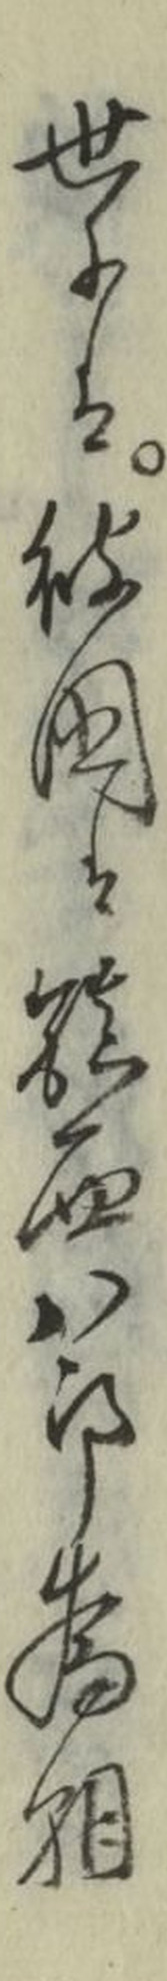世には。彼国は鎮西八郎為朝
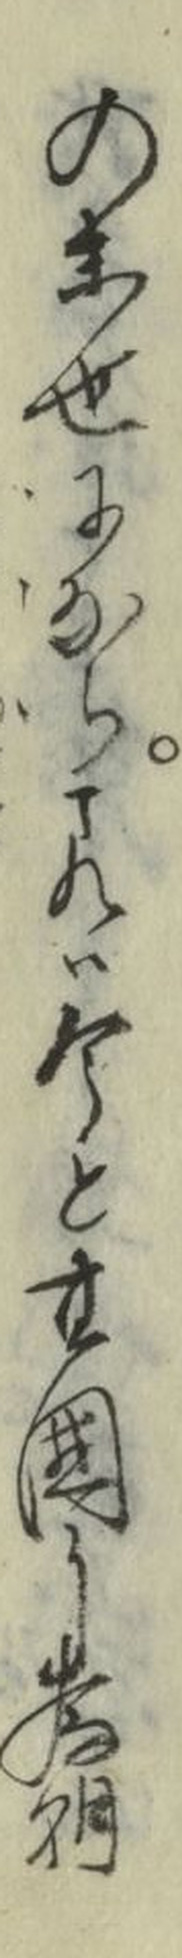の末世になり。されは今と其国に為朝

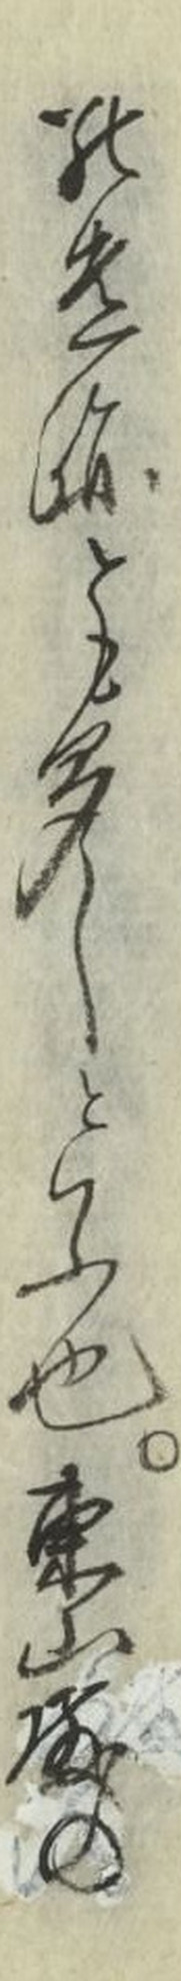の遺跡とも多しといふ也。東山殿の
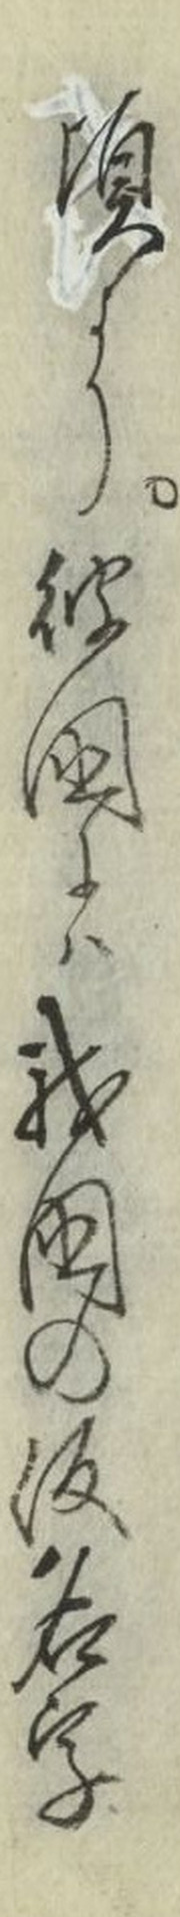頃より。彼国には我国の仮名字
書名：琉球人来朝記 一之二
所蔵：University of the Ryukyus Library
